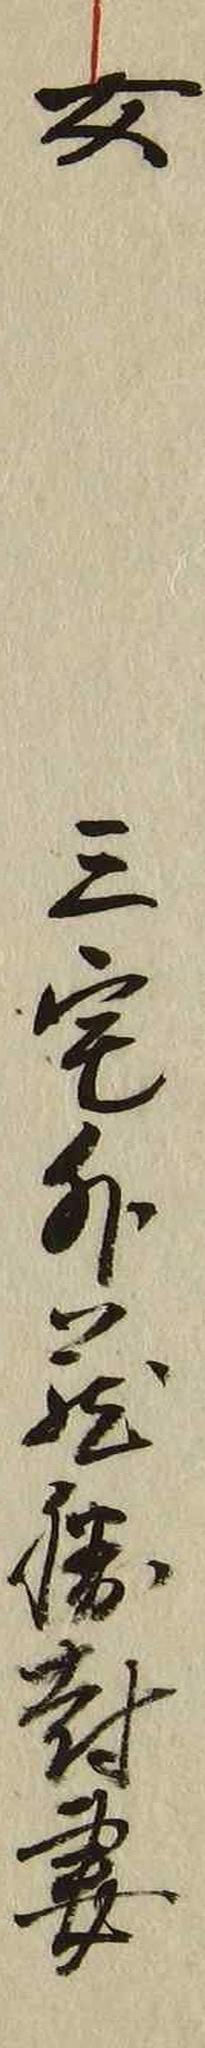女三宅外蔵勝封妻
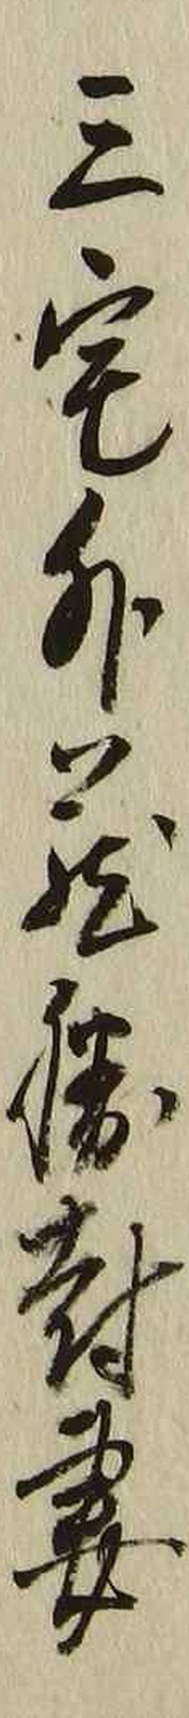女三宅外蔵勝封妻
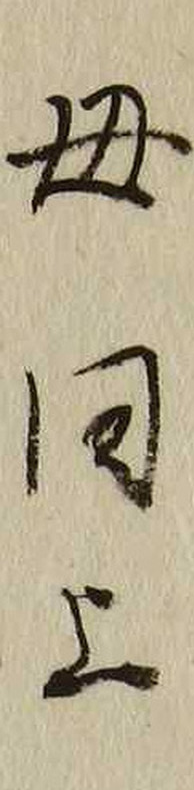母同上
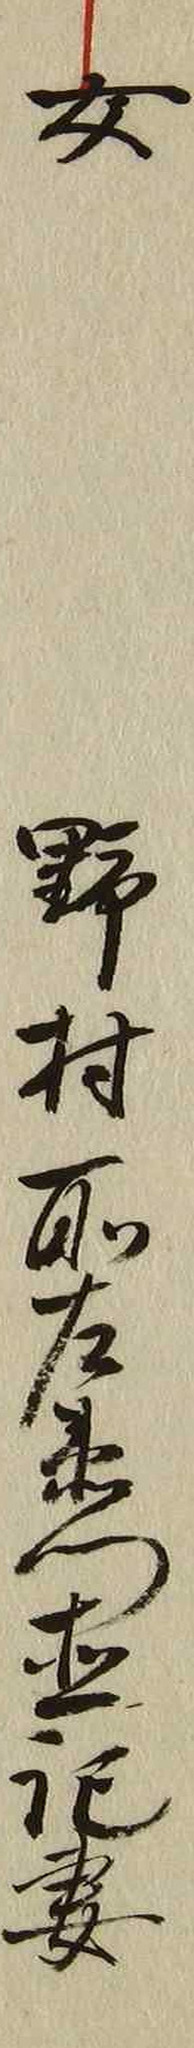女野村所左衛門直記妻
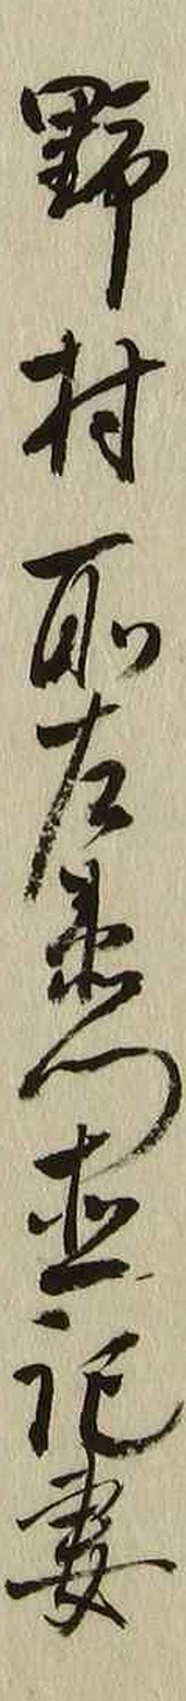女野村所左衛門直記妻
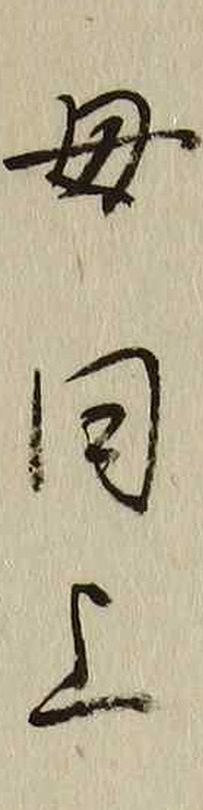母同上
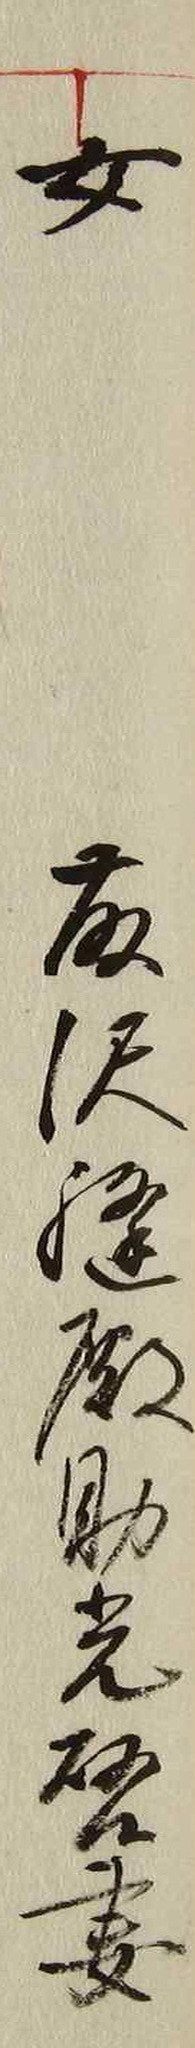女藤沢縫殿助光啓妻
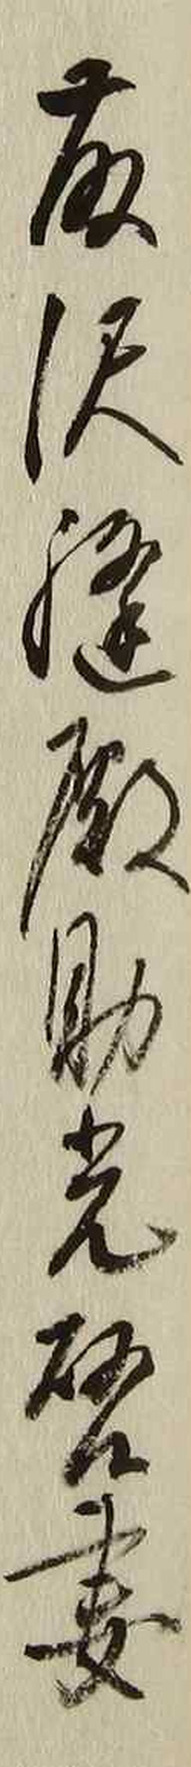女藤沢縫殿助光啓妻
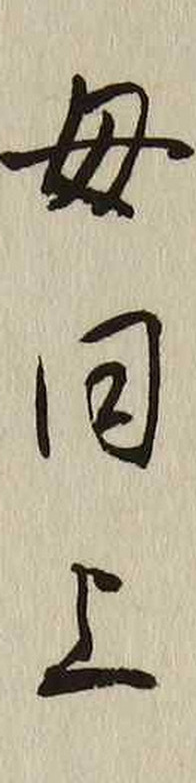母同上
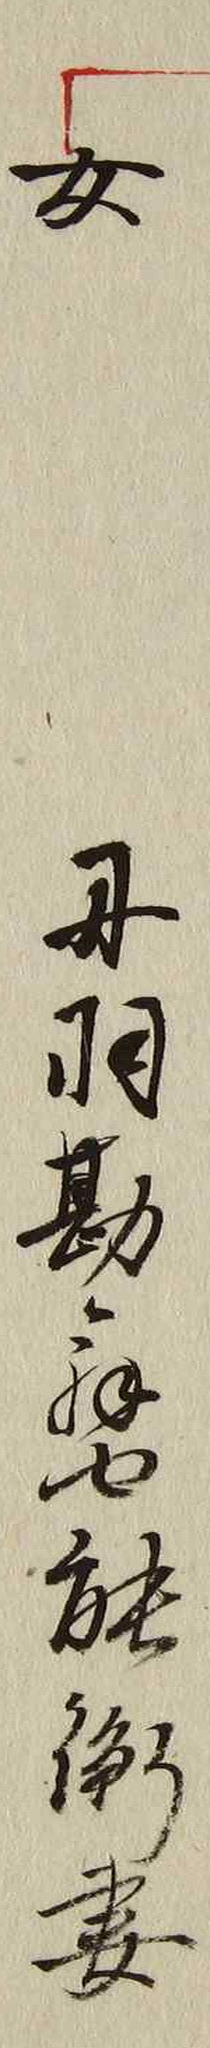女丹羽勘解由能衡妻
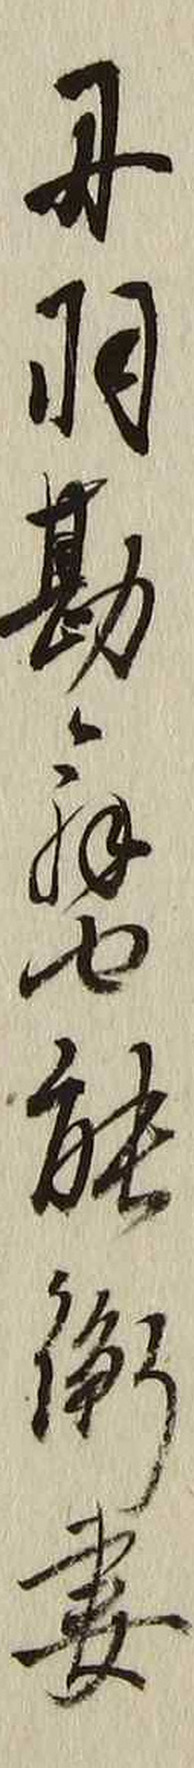女丹羽勘解由能衡妻
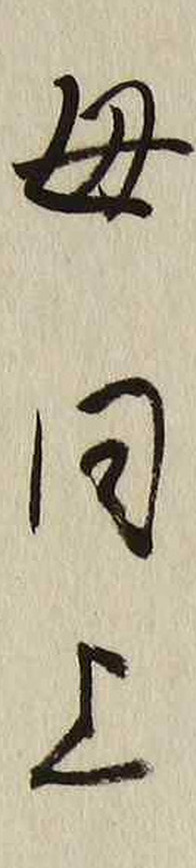母同上

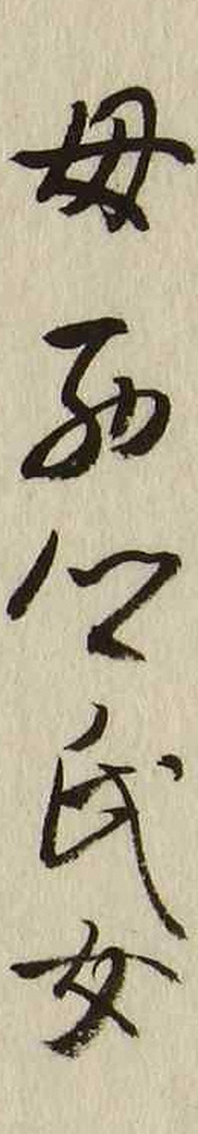母西郷氏女
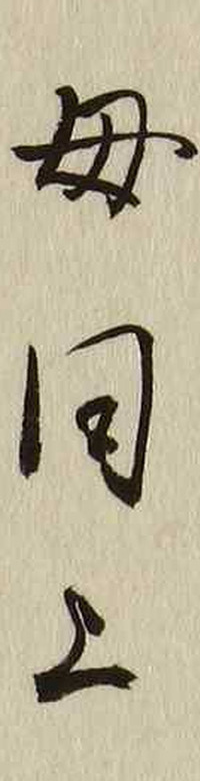母同上
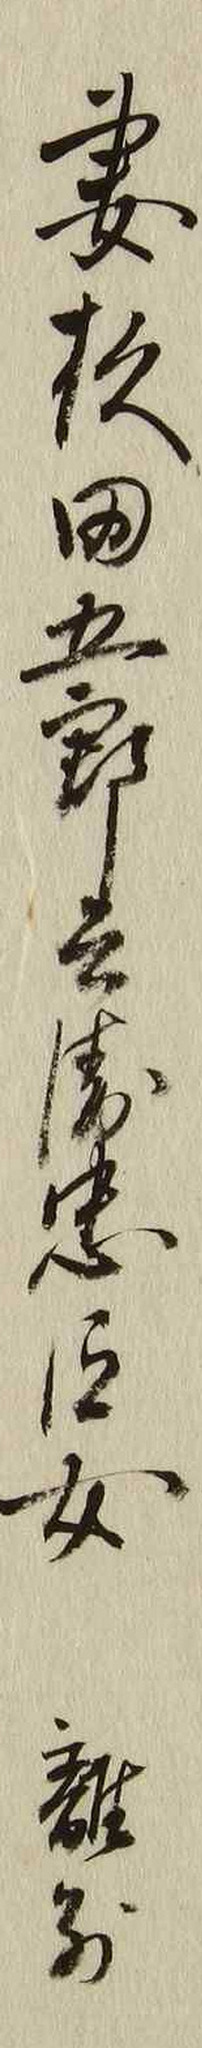妻杉田五郎兵衛忠臣女離別
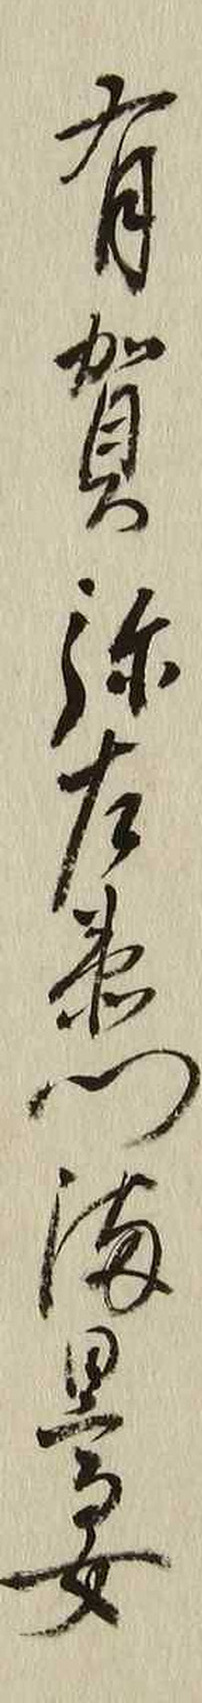有賀弥左衛門満暠女
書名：諸士系譜　巻之351　す之部1
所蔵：会津若松市立会津図書館
